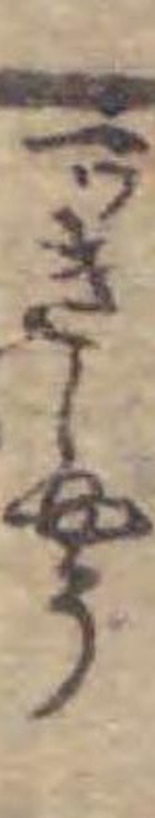一つきしやう
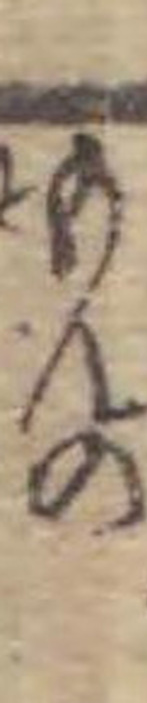もんの
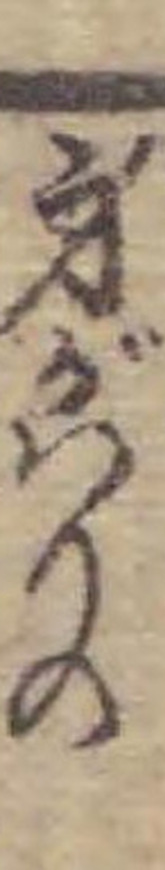身がはりの
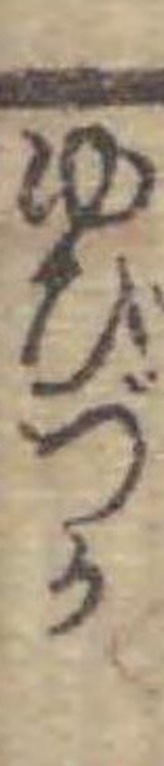ゆびづか
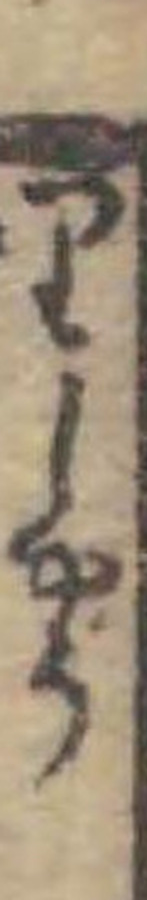りしやう
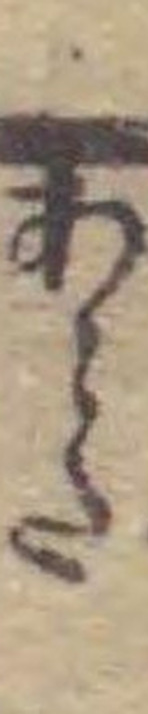あらた
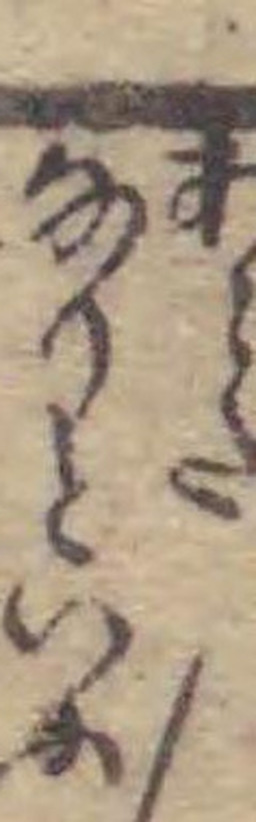なりといふ
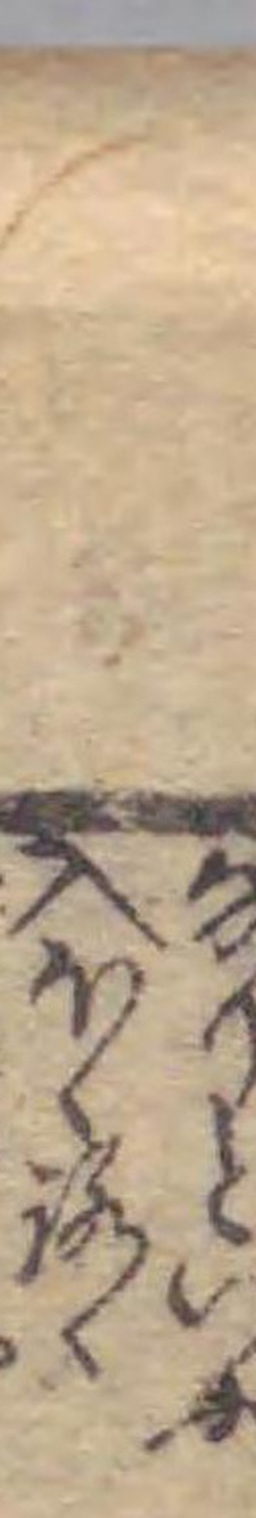入ほくろゝ
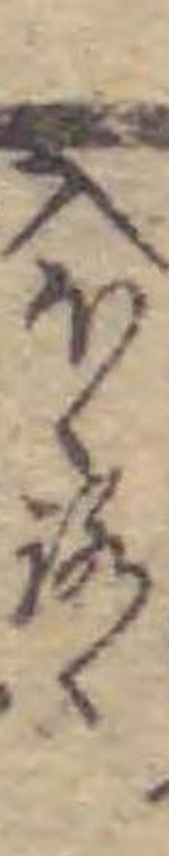入ほくろゝ
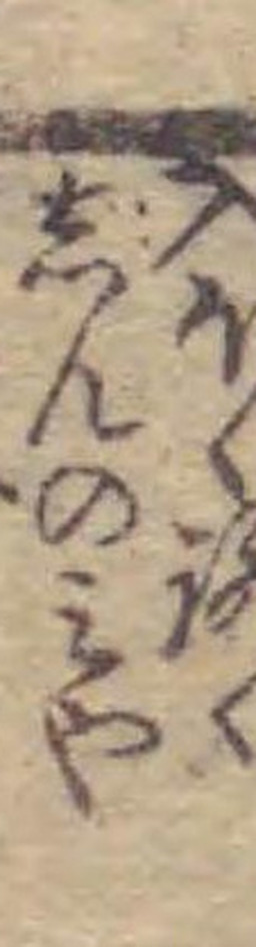じんのみや
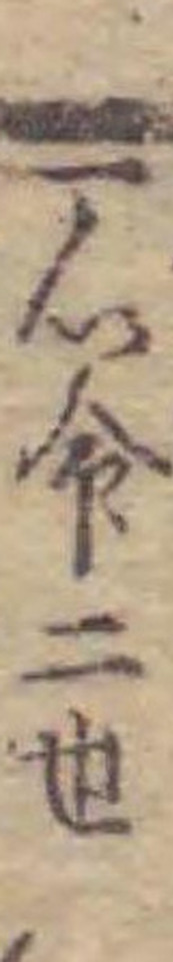一心命二世
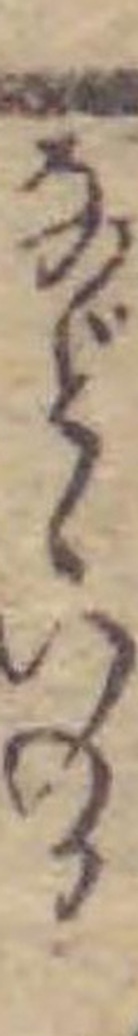などゝいのる

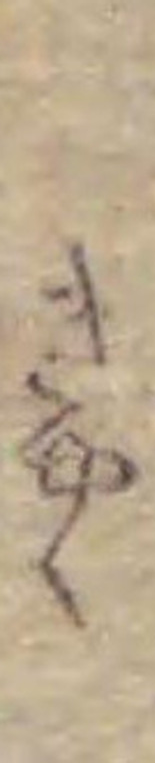きやく
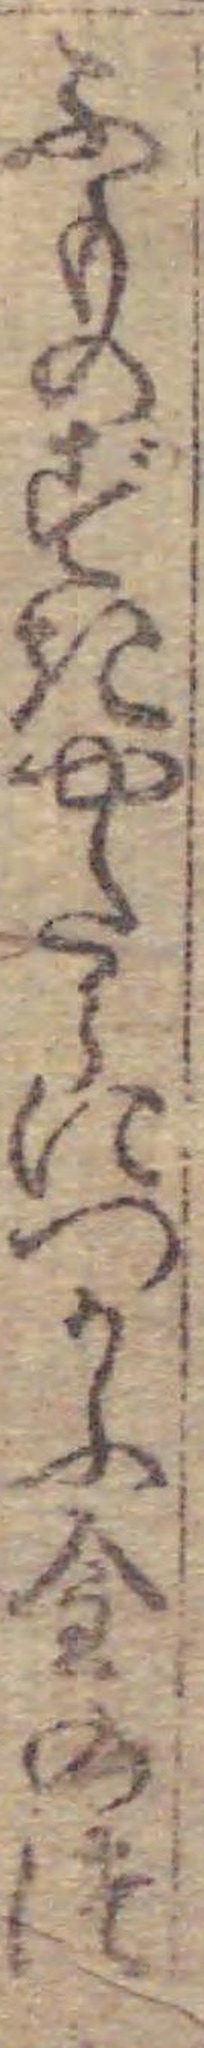ふものずきやたらにつかふ金のつら
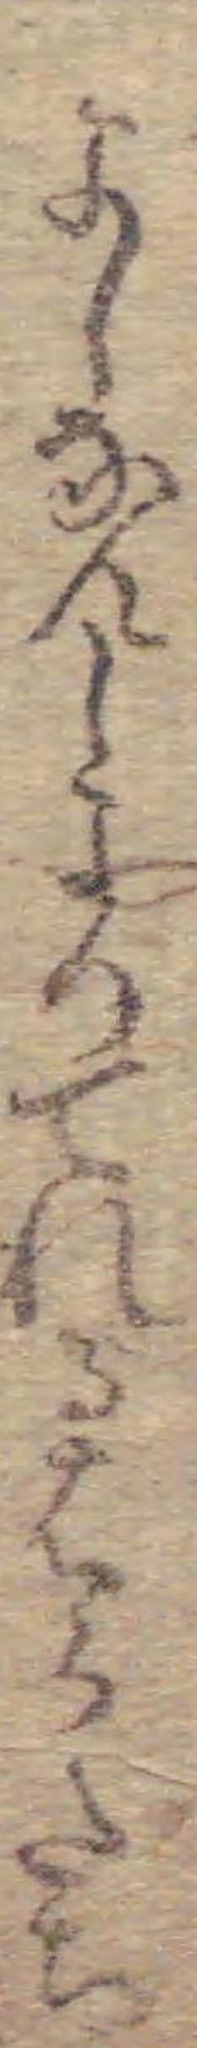よしなんしよりてれるはらたち
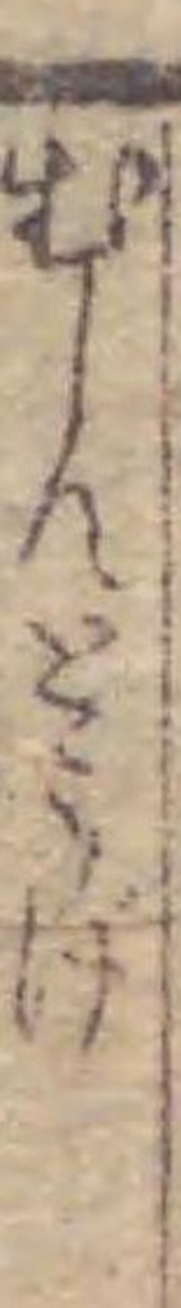むしんとうげ
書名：北国順礼唄方便 : 3巻
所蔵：国立国会図書館 National Diet Library, JAPAN
